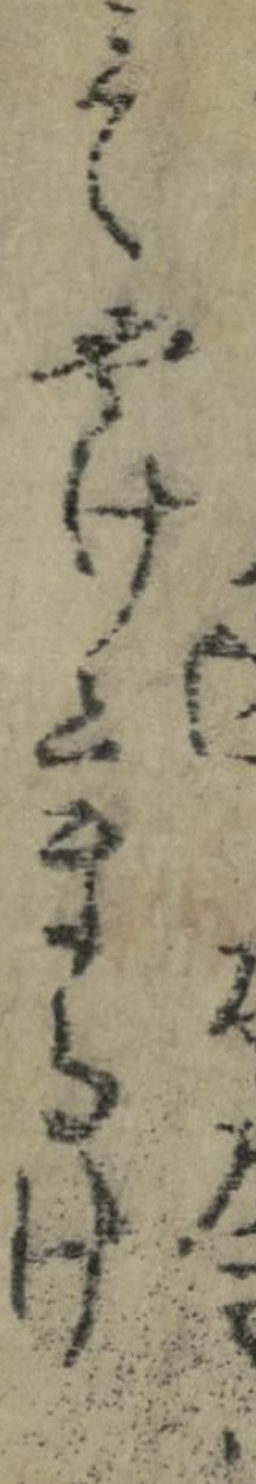二てやけとまるけ
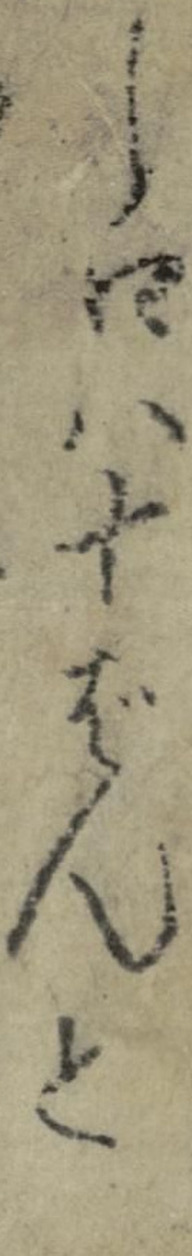し口ハ十ばんと
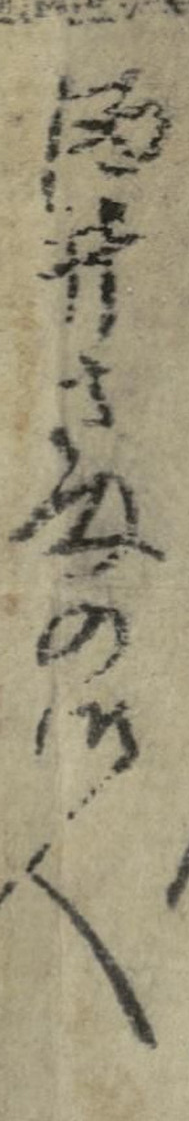酒井さまの御人
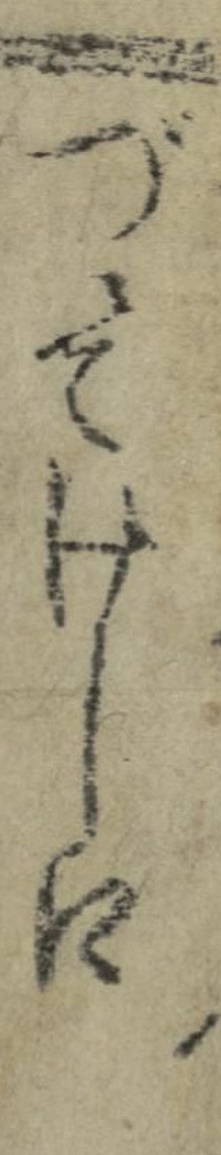づ二てけし口
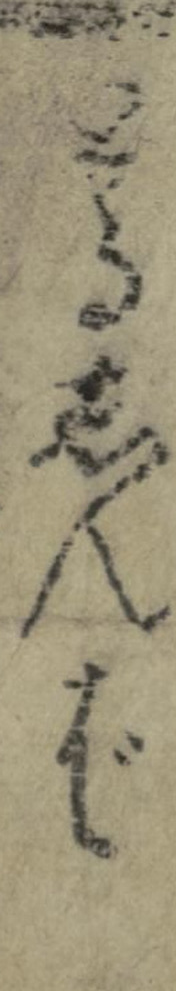とるしんば
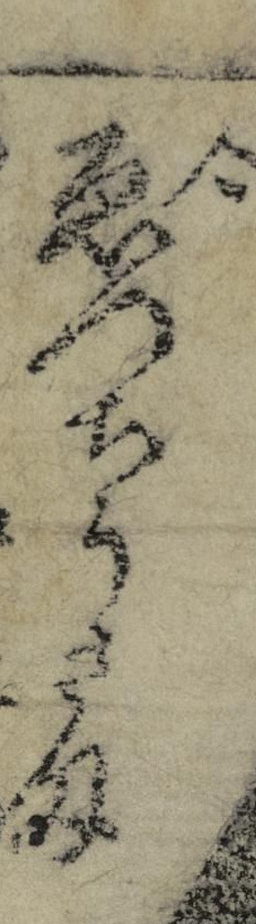ゑつちうさま
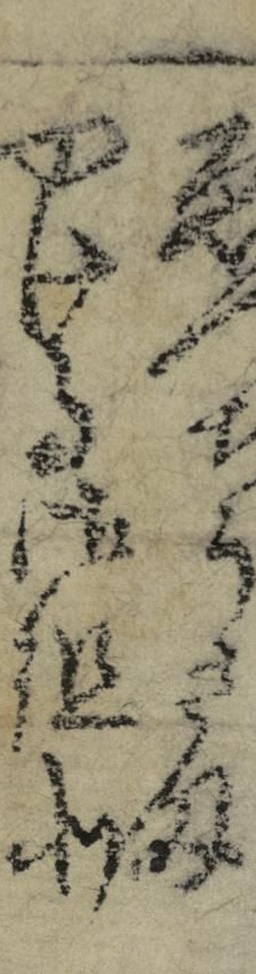やける御組北
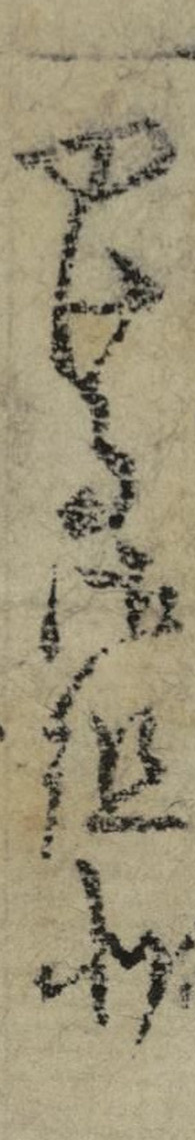やける御組北
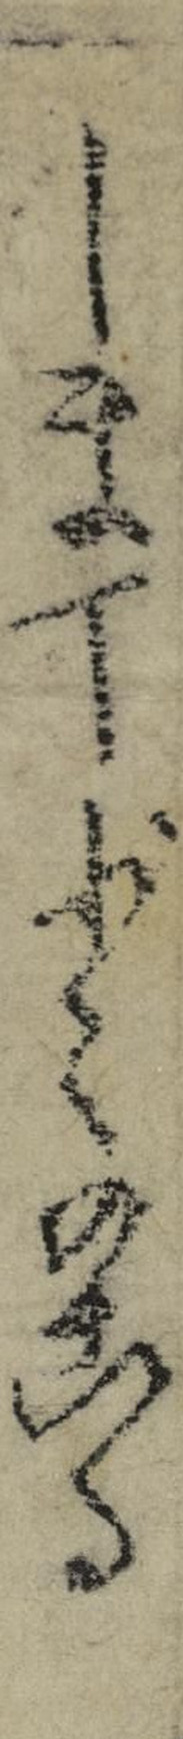しま丁少々のこる
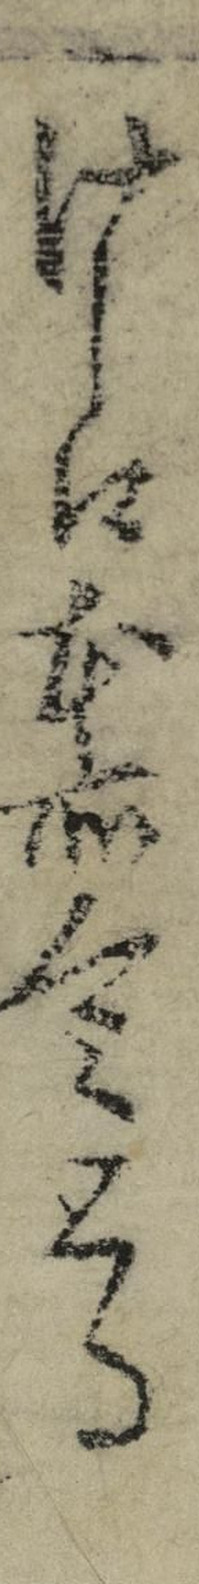けし口本所くミとる
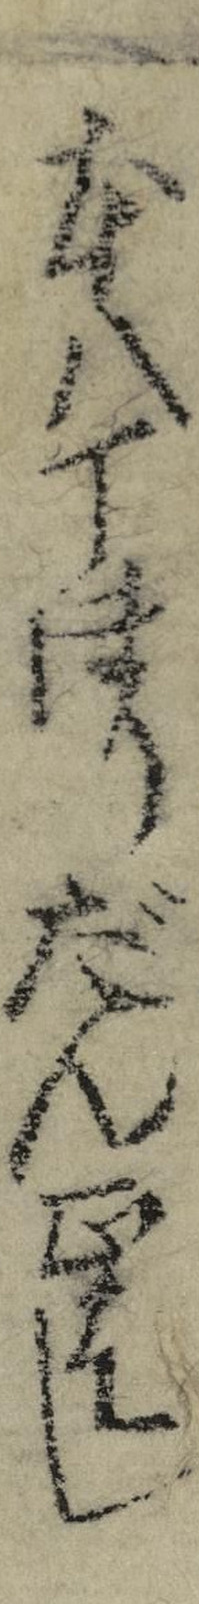本八丁ほりだん正はし
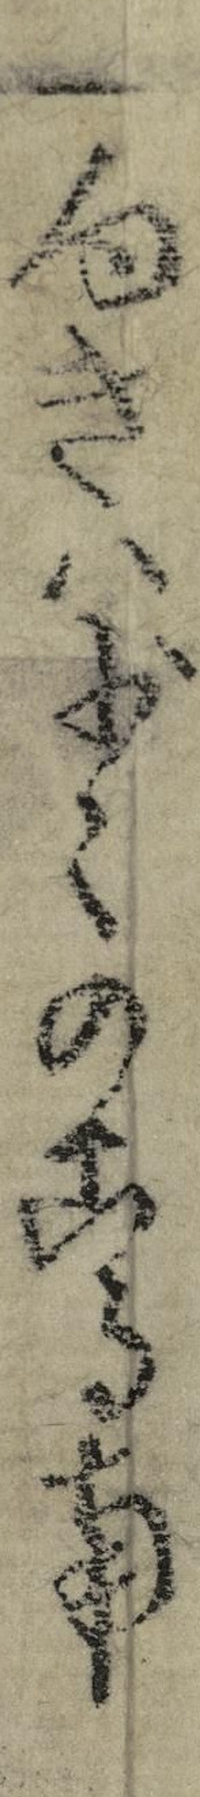向きハ少々のこる南
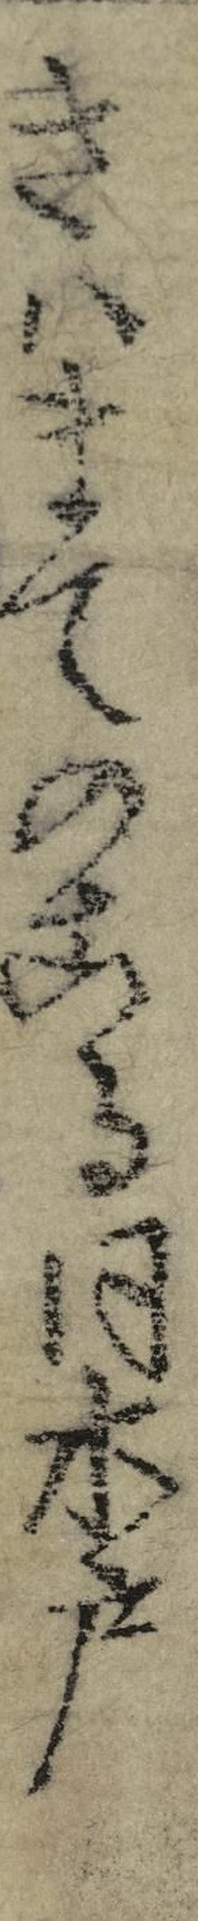きハまてのこる同木戸
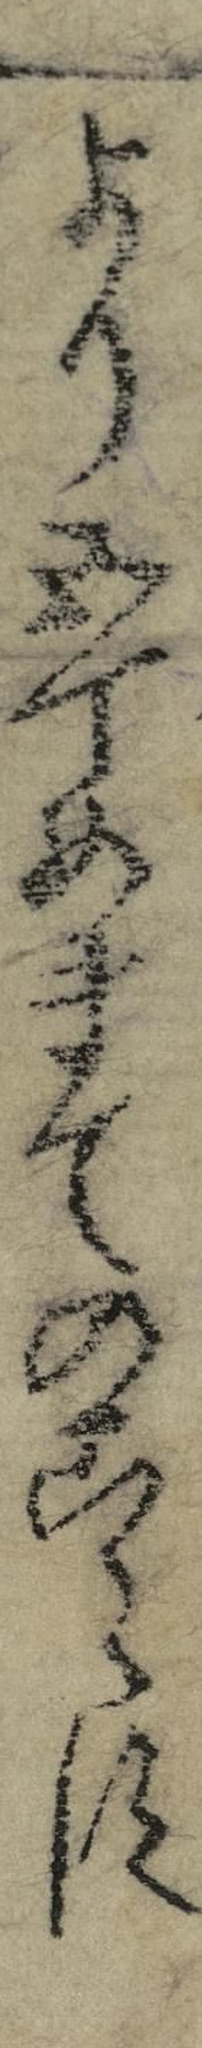より五丁めまでのこらす
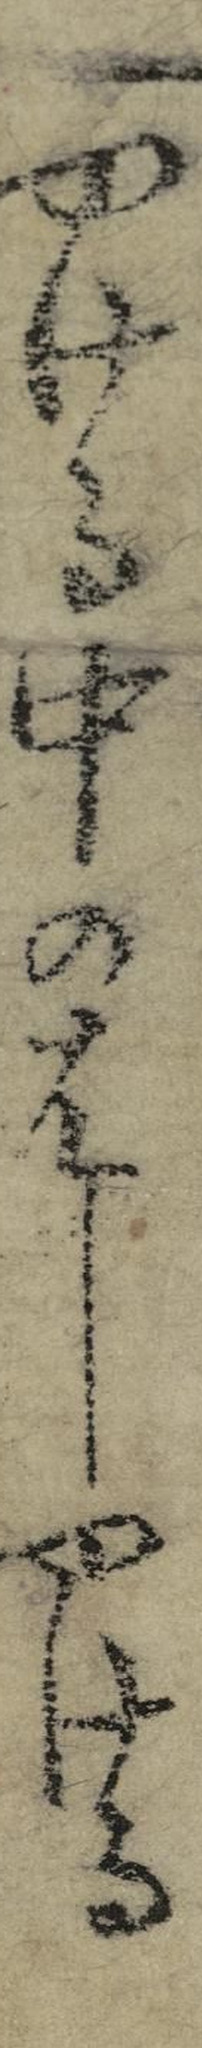やける中のはしやける
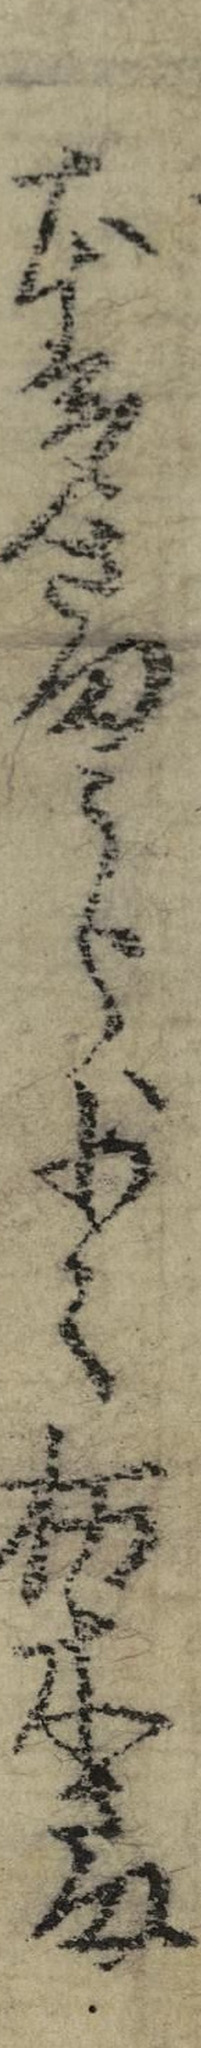本多さまうら少々朽木さま
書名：[慶応二年十一月の江戸大火に関する瓦版]
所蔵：東京大学地震研究所図書室 Earthquake Research Institute Library, The University of Tokyo, JAPAN
